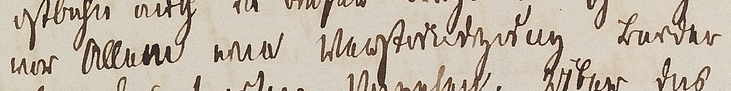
vor Allem eine Verständigung Beider
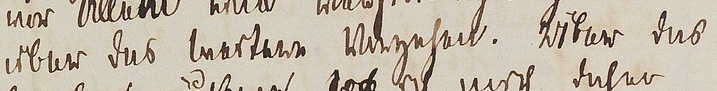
über das weitere Vorgehen. Über das
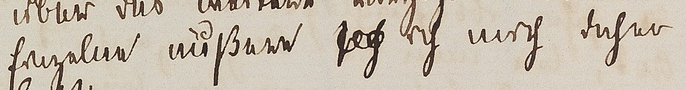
Einzelne äußere sich ich mich daher
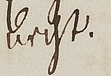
nicht.
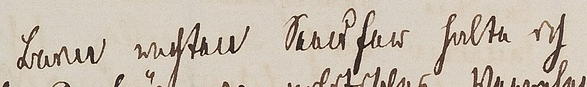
Beim rechten Seeufer halte ich
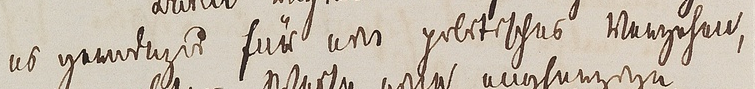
es geradezu für ein politisches Vergehen,
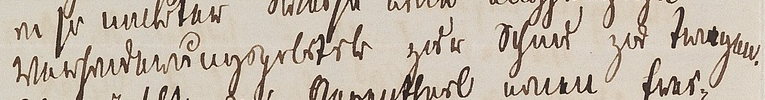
Verhinderungspolitik zur Schau zu tragen.
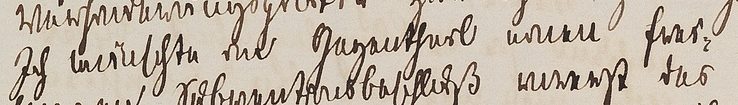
Ich wünschte im Gegentheil einen frei-
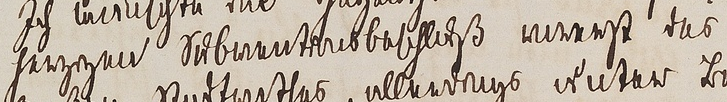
herzigen Subventionsbeschluß vorerst des
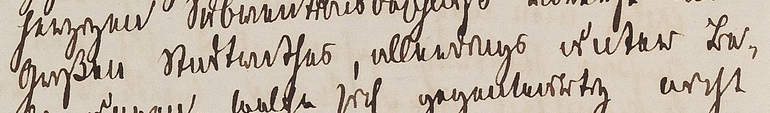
Großen Stadtrathes, allerdings unter Be-
